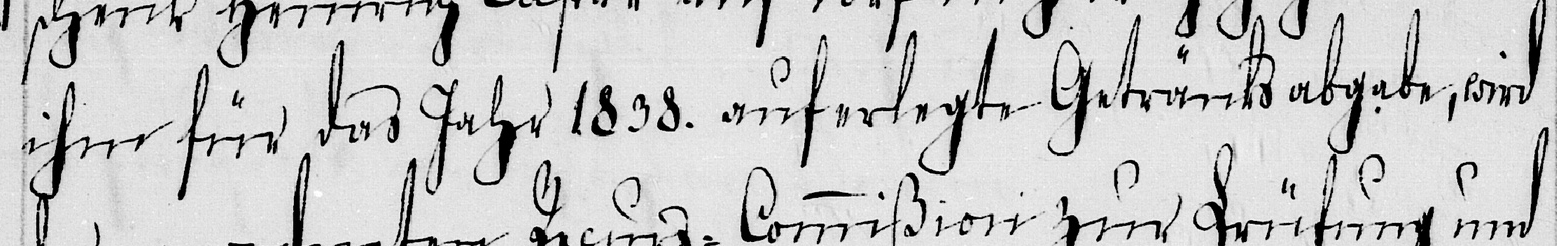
ihm für das Jahr 1838. auferlegte Getränksabgabe, wird
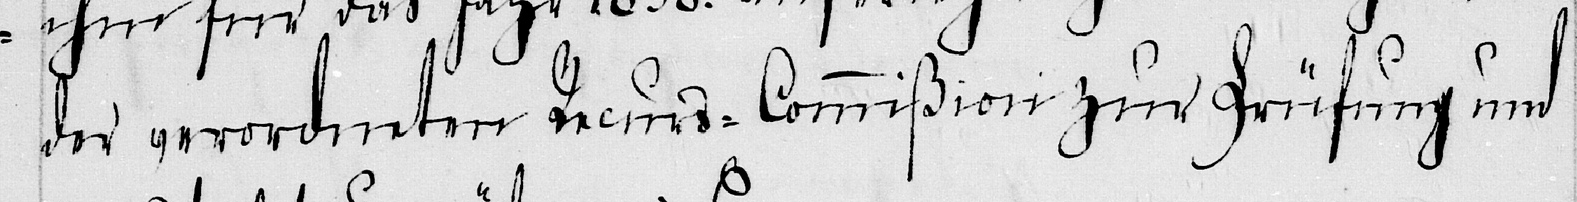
der verordneten Recurs-Commißion zur Prüfung und
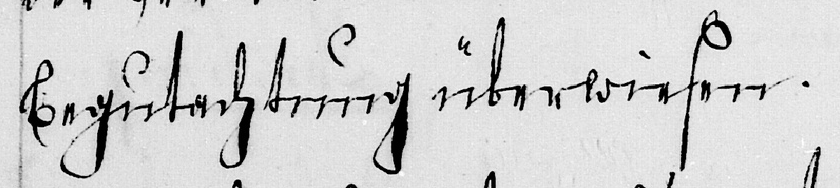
Begutachtung überwiesen.
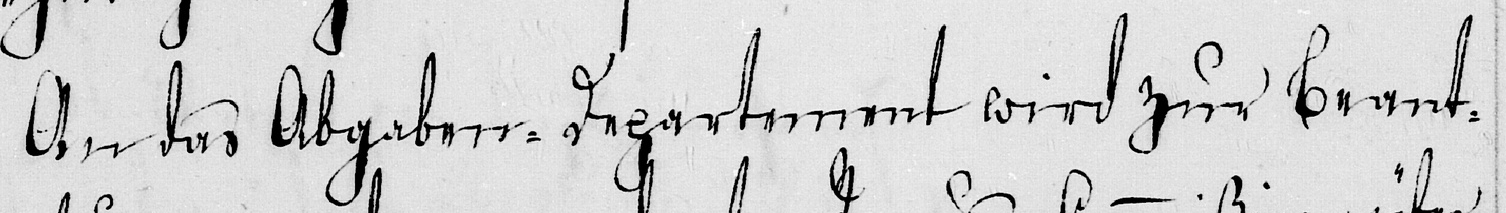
An das Abgaben-Departement wird zur Beant¬
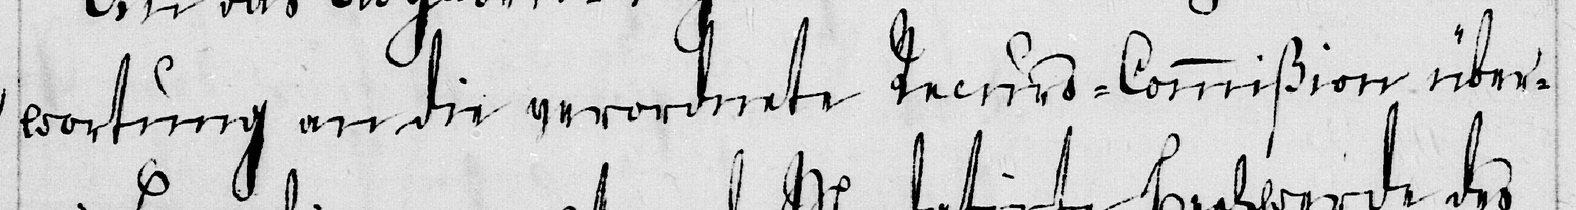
wortung an die verordnete Recurs-Commißion über¬
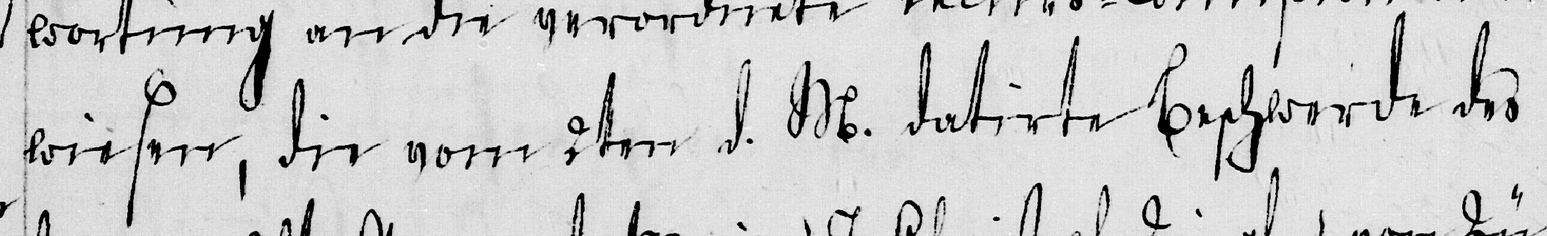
wiesen, die vom 2ten d. M. datirte Beschwerde des
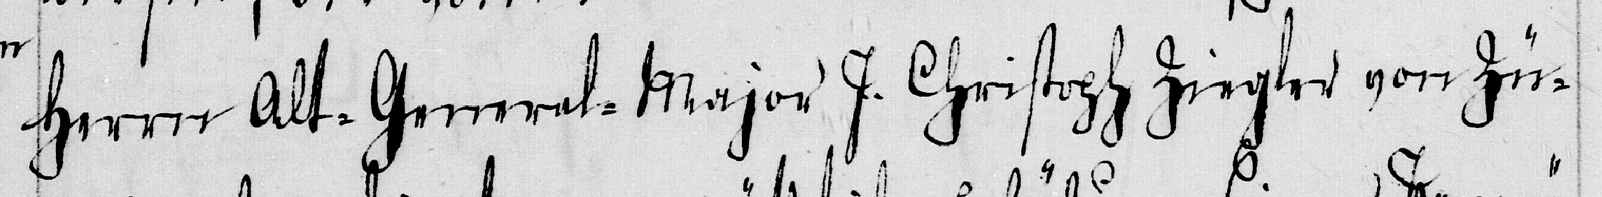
Herrn Alt-General-Major J. Christoph Ziegler von Zü¬
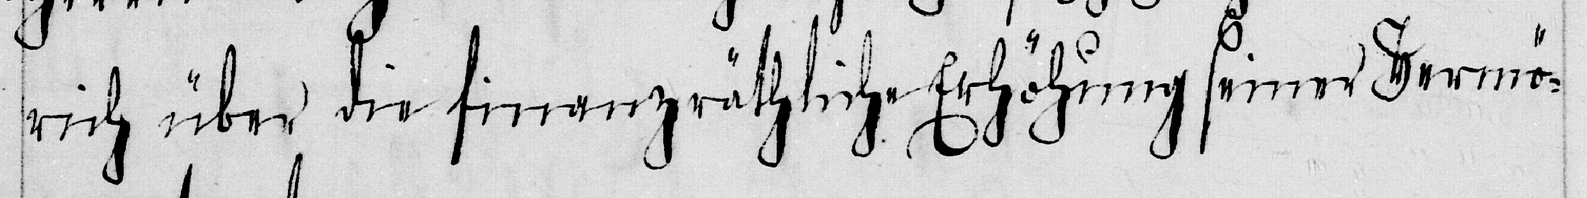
rich über die finanzräthliche Erhöhung seiner Vermö¬
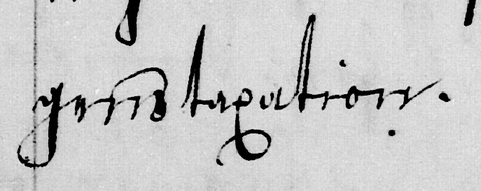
genstaxation.
